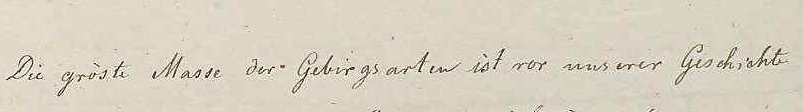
Die gröste Masse der Gebirgsarten ist vor unserer Geschichte
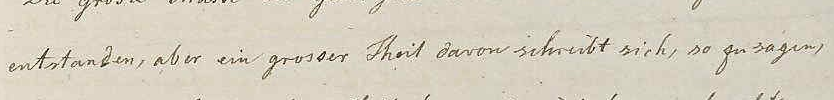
entstanden, aber ein grosser Theil davon schreibt sich, so zu sagen,
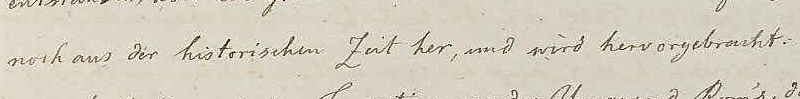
noch aus der historischen Zeit her, und wird hervorgebracht:
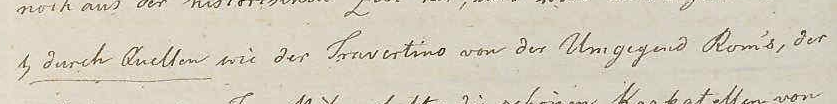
1, durch Quellen wie der Travertino von der Umgegend Rom's, der
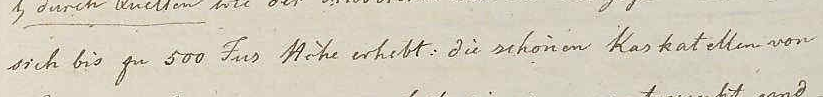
sich bis zu 500 Fus Höhe erhebt: die schönen Kaskatellen von
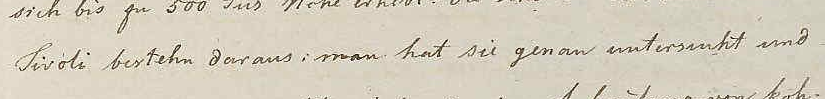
Tivoli bestehn daraus: man hat sie genau untersucht und
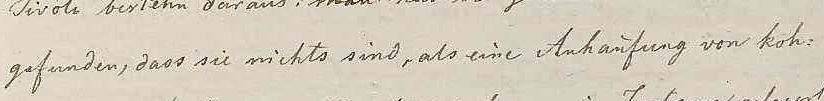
gefunden, dass sie nichts sind, als eine Anhäufung von koh-
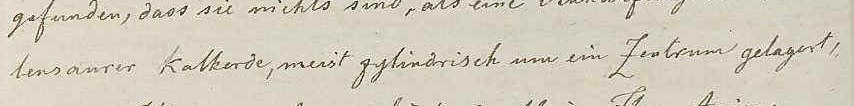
lensaurer Kalkerde, meist zylindrisch um ein Zentrum gelagert,
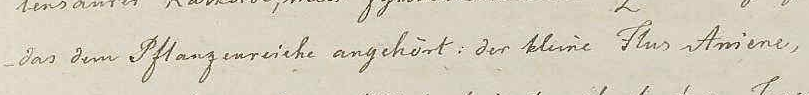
das dem Pflanzenreiche angehört: der kleine Flus Aniene,
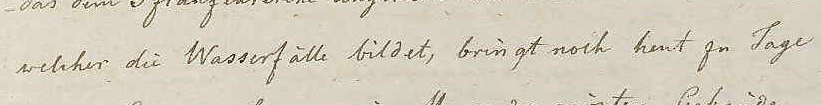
welcher die Wasserfälle bildet, bringt noch heut zu Tage
